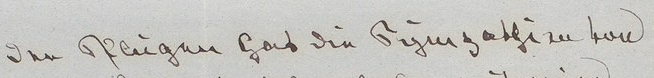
Der Splügen hat die Sympathien von
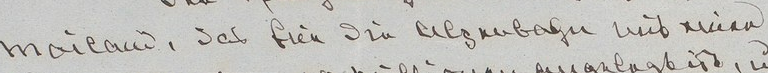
Mailand, das für die Alpenbahn mit einer
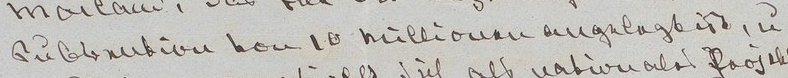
Subvention von 10 Millionen angelegt ist, u
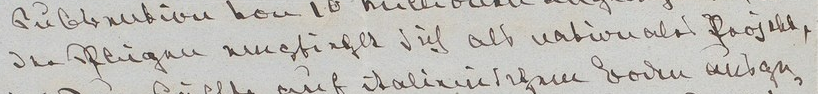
der Splügen empfiehlt sich als nationales Projekt,
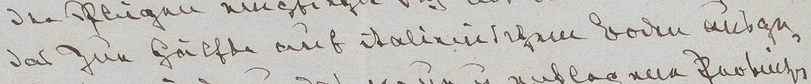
das zur Hälfte auf italienischem Boden ausge-
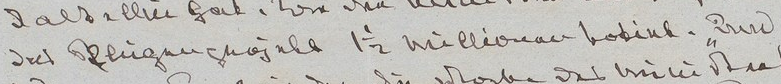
das Splügenprojekt 1½ Millionen votirt «und
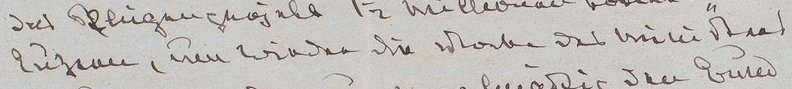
Luzern, um wieder die Worte des Ministers
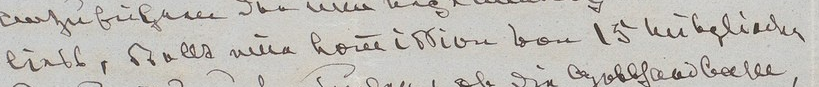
liest, stellt eine Kommission von 15 Mitgliedern
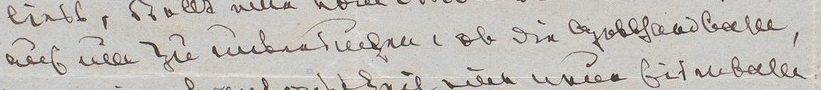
auf um zu untersuchen, ob die Gotthardbahn,
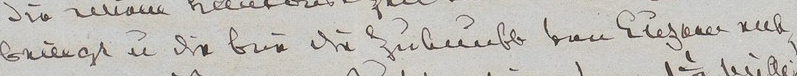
bringt u die für die Zukunft von Luzern ent-
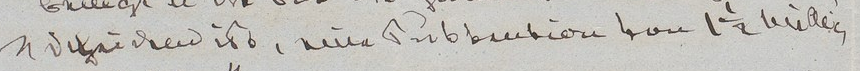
scheidend ist, eine Subvention von 1½ Millionen
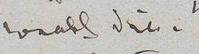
werth sei.»
